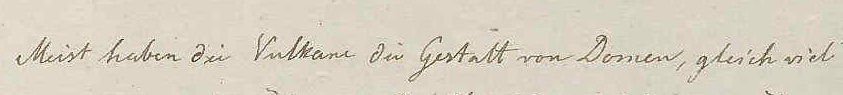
Meist haben die Vulkane die Gestalt von Domen, gleich viel
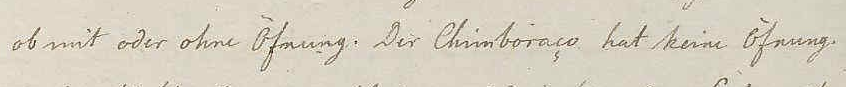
ob mit oder ohne Öfnung. Der Chimboraço hat keine Öfnung
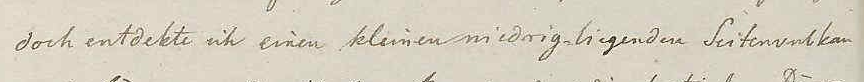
doch entdekte ich einen kleinen niedrig-liegenden Seitenvulkan
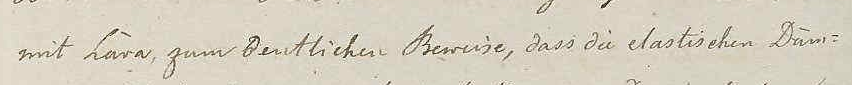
mit Lava, zum deutlichen Beweise, dass die elastischen Däm-
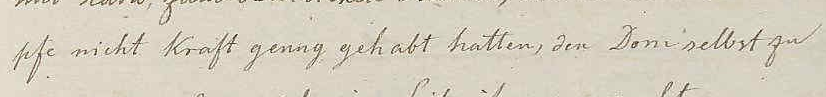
pfe nicht Kraft genug gehabt hatten, den Dom selbst zu
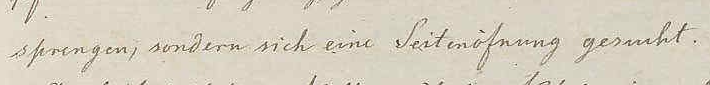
sprengen, sondern sich eine Seitenöfnung gesucht.
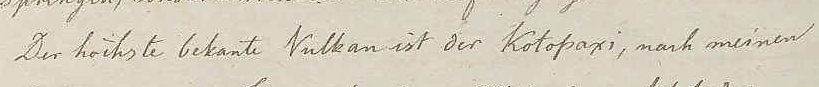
Der höchste bekante Vulkan ist der Kotopaxi, nach meinen
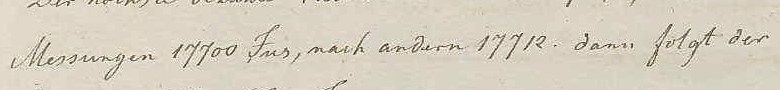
Messungen 17700 Fus, nach andern 17712, dann folgt der
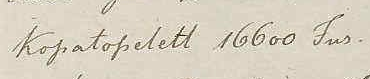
Kopatopeletl 16600 Fus.
